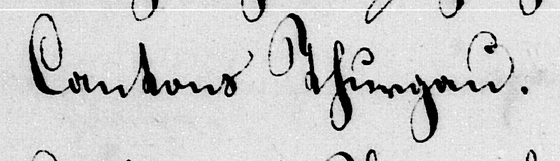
Cantons Thurgau.
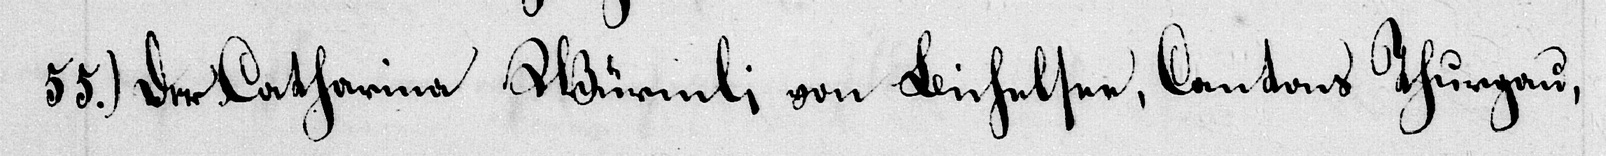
55.) Der Catharina Würmli von Bichelsen, Cantons Thurgau,
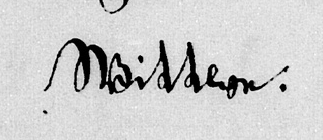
Wittwe.
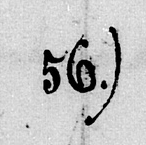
56.)
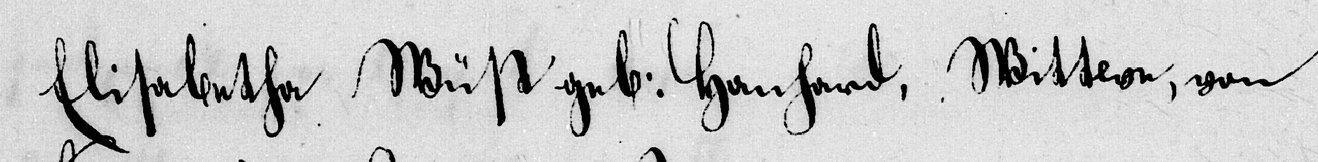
Elisabetha Wüst geb: Hanhard, Wittwe, von
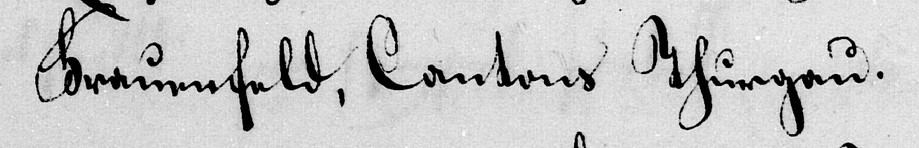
Frauenfeld, Cantons Thurgau.
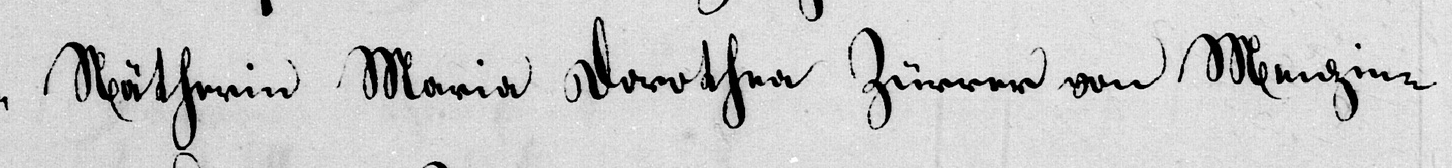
Nätherin Maria Dorothea Zürrer von Menzin¬
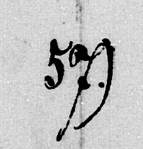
57.)
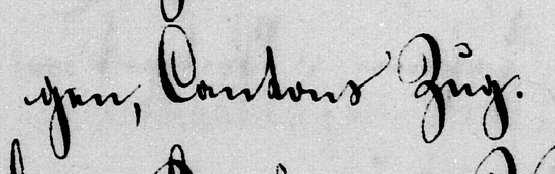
gen, Cantons Zug.
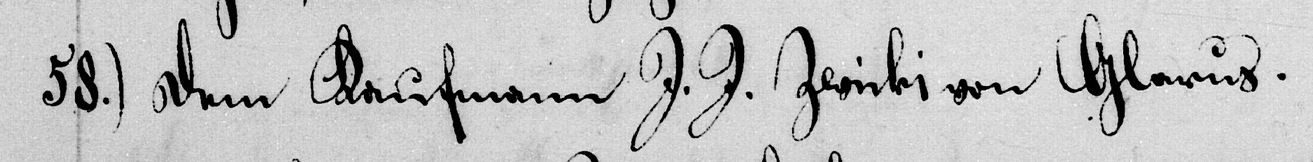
58.) Dem Kaufmann J. J. Zwicki von Glarus.
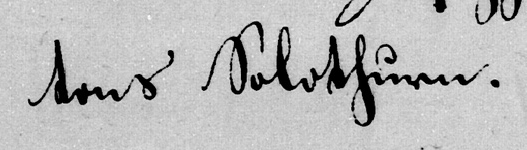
tons Solothurn.
